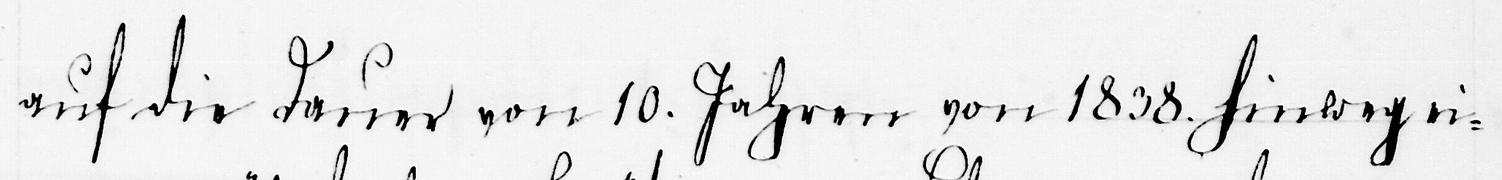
auf die Dauer von 10. Jahren von 1838. hinweg ei¬
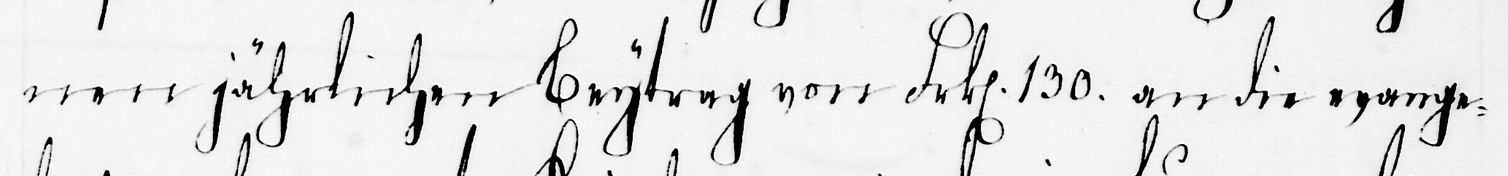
nen jährlichen Beytrag von Frk[en]. 130. an die evange¬
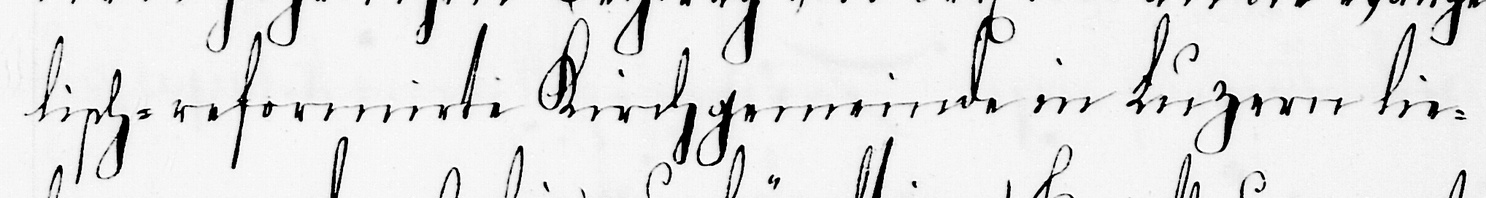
lisch-reformirte Kirchgemeinde in Luzern lie¬
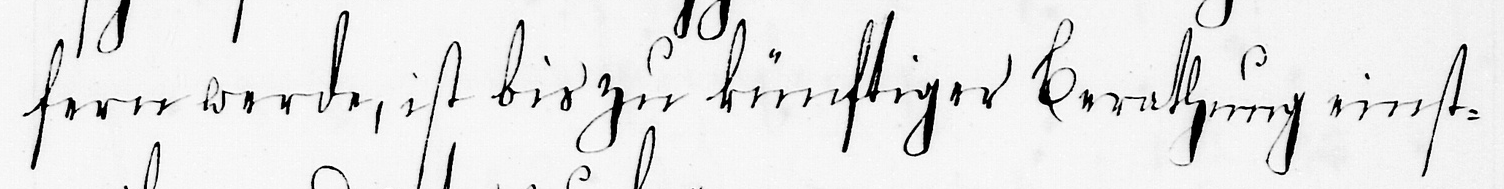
fern werde, ist bis zu künftiger Berathung einst¬
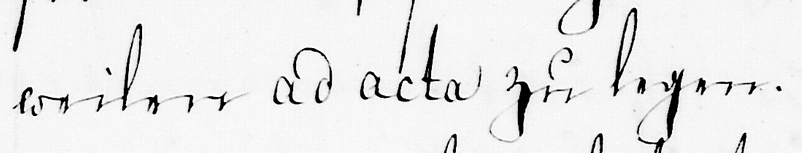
weilen ad acta zu legen.
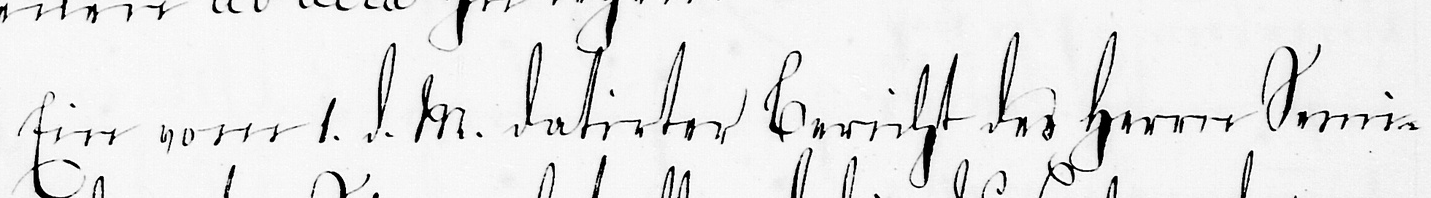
Ein vom 1. d. M. datirter Bericht des Herrn Semi¬
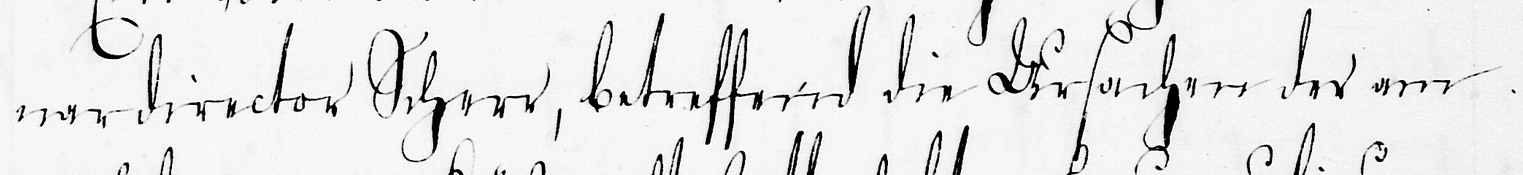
nardirector Scherr, betreffend die Ursachen der am
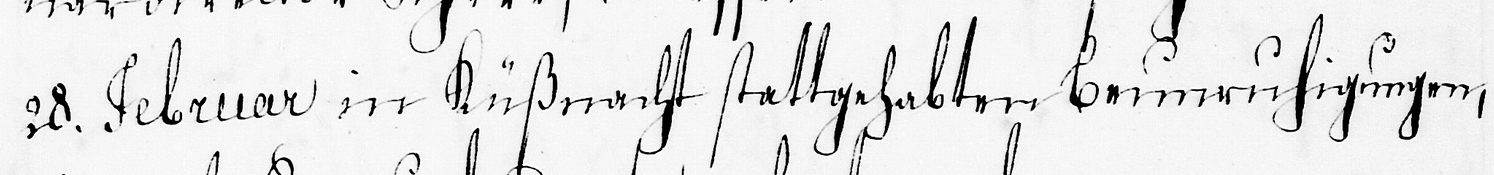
28. Februar in Küßnacht stattgehabten Beunruhigungen,
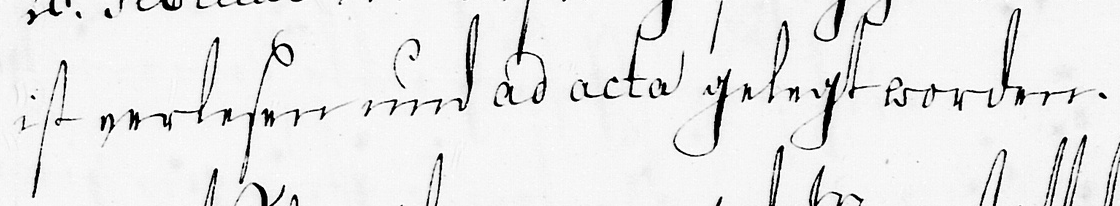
ist verlesen und ad acta gelegt worden.
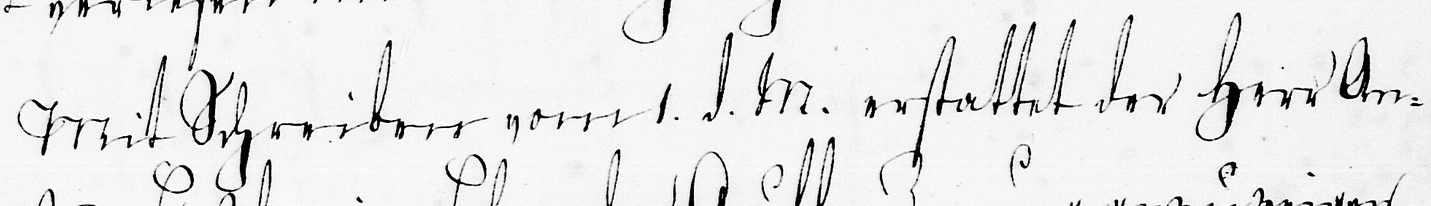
Mit Schreiben vom 1. d. M. erstattet der Herr An¬
